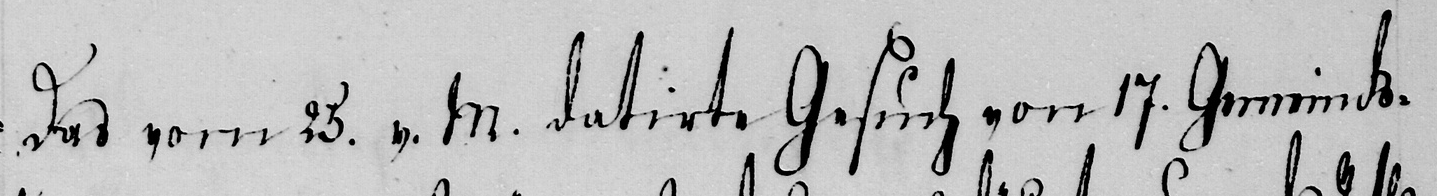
Das vom 25. v. M. datirte Gesuch von 17. Gemeinds¬
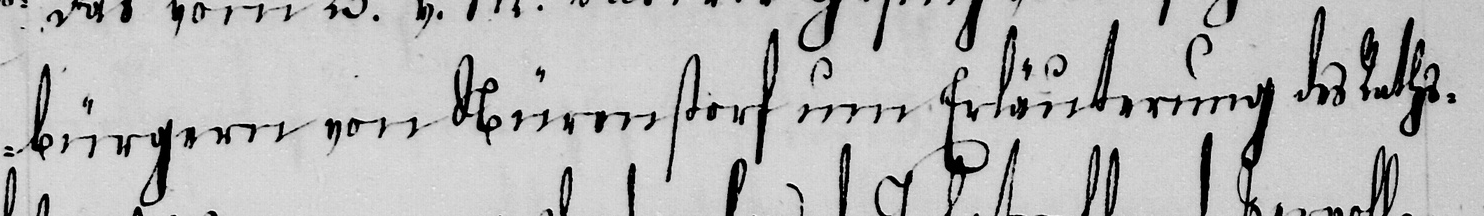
bürgern von Nürenstorf um Erläuterung des Raths¬
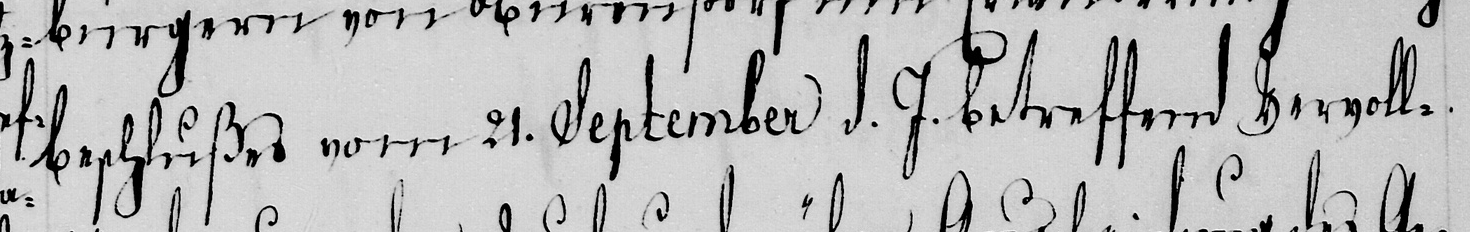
beschlußes vom 21. September d. J. betreffend Vervoll¬
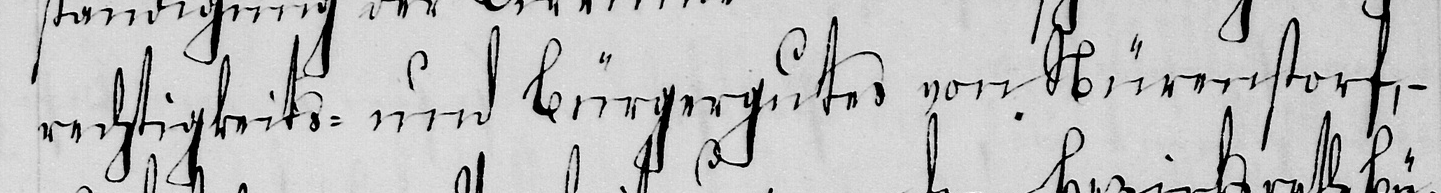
rechtigkeits- und Bürgergutes von Nürenstorf, –
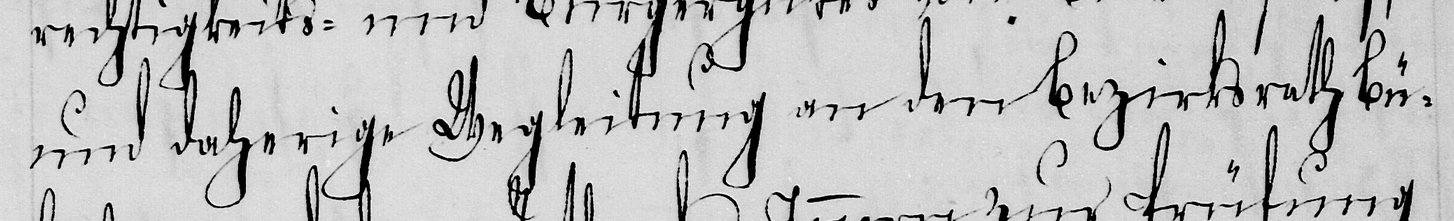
und daherige Wegleitung an den Bezirksrath Bü¬
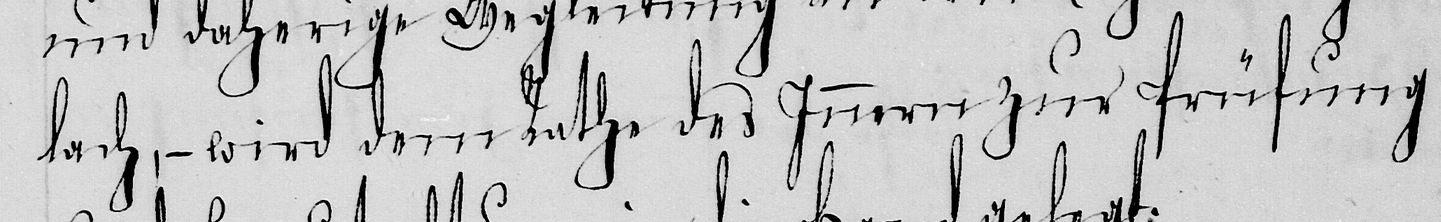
lach, – wird dem Rathe des Innern zur Prüfung
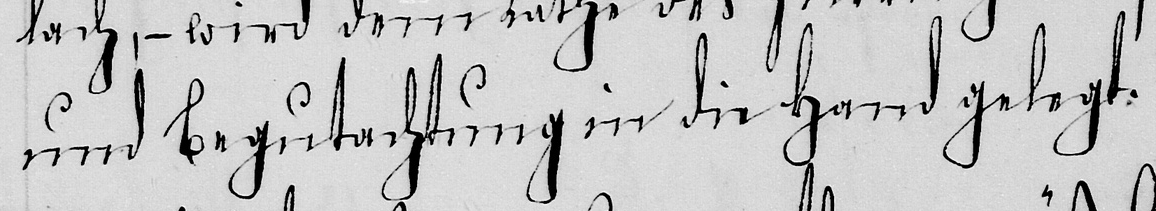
und Begutachtung in die Hand gelegt.
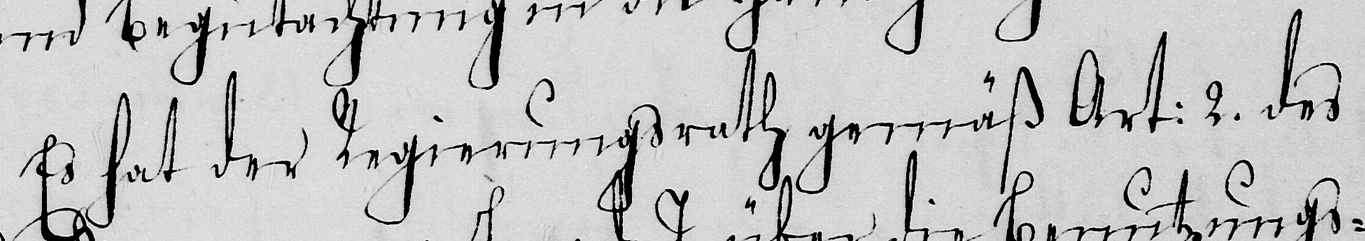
Es hat der Regierungsrath gemäß Art: 2. des
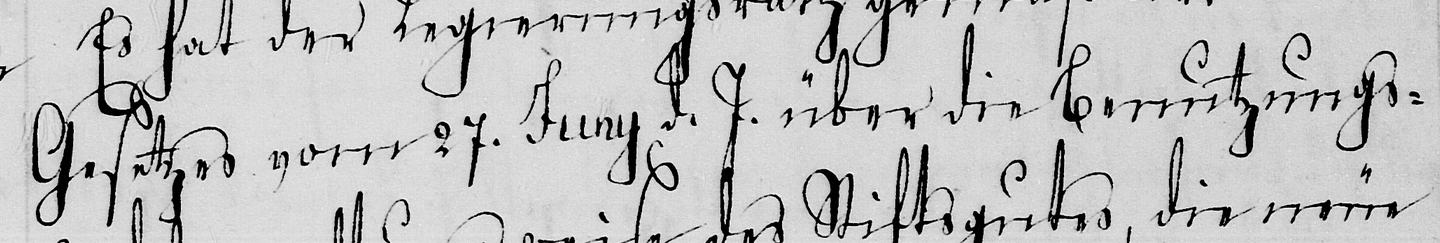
Gesetzes vom 27. Juny d. J. über die Benutzungs-
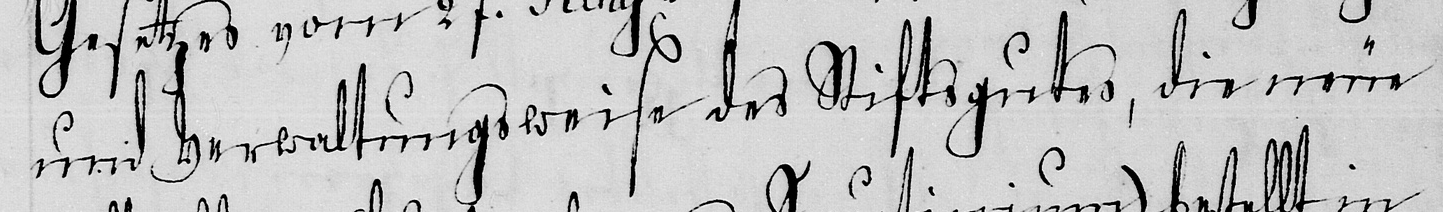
und Verwaltungsweise des Stiftsgutes, die neue
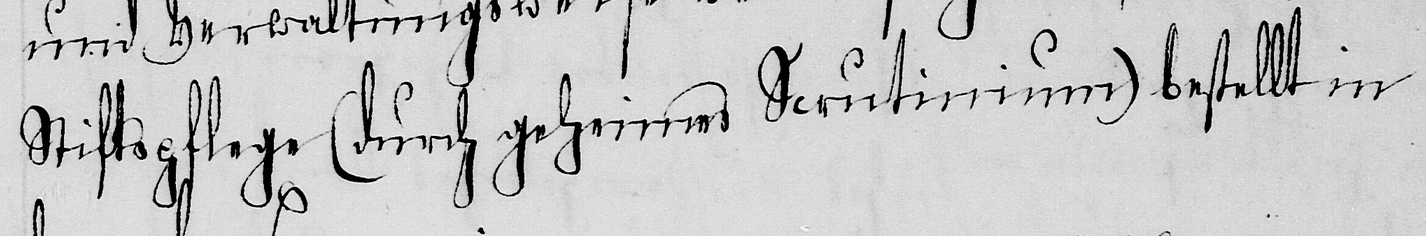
Stiftspflege (durch geheimes Scrutinium) bestellt in
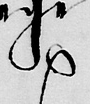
r.
